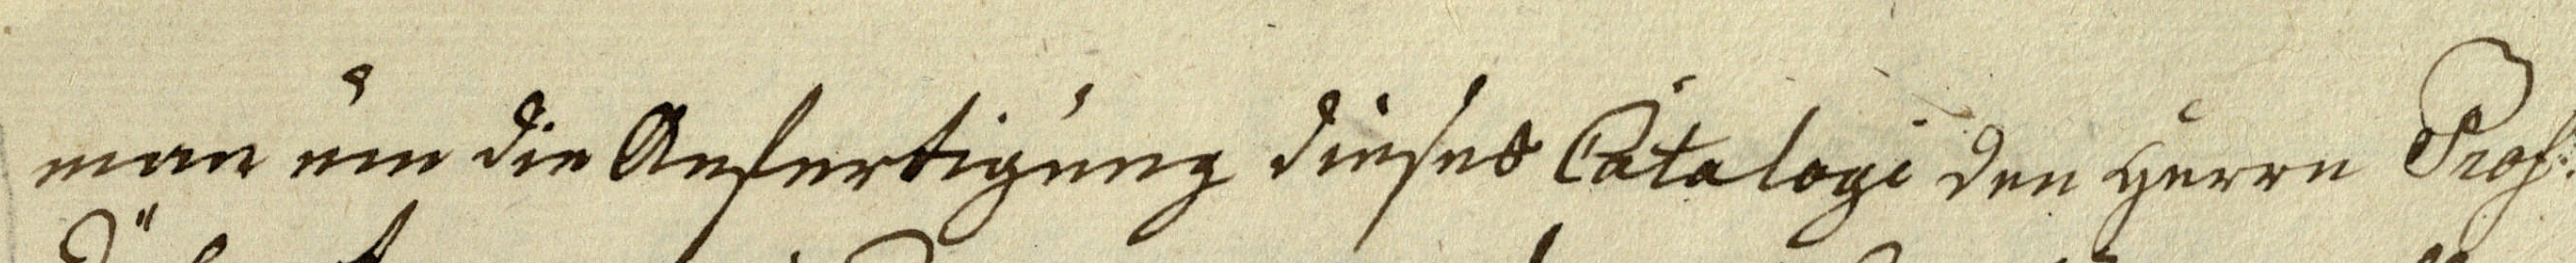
man um die Anfertigung dieses Catalogi den Herrn Prof.
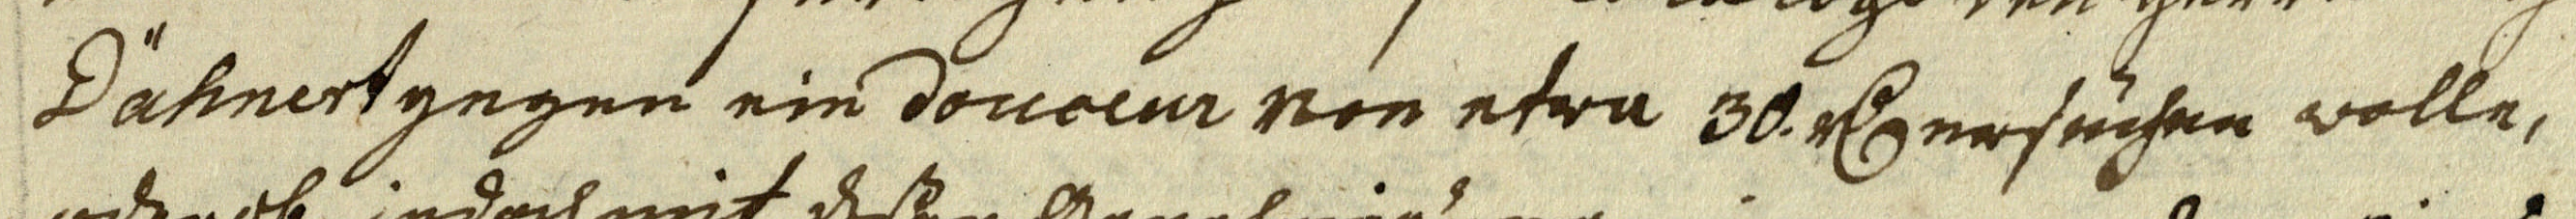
Dähnert gegen ein douceur von etwa 30 rtl ersuchen wolle,
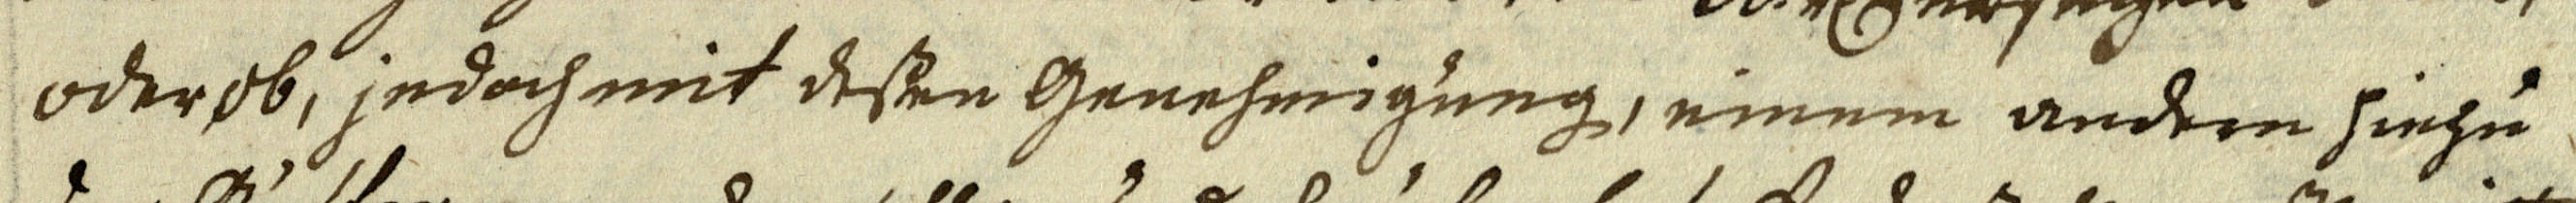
oder ob, jedoch mit dessen Genehmigung einem andern hiezu
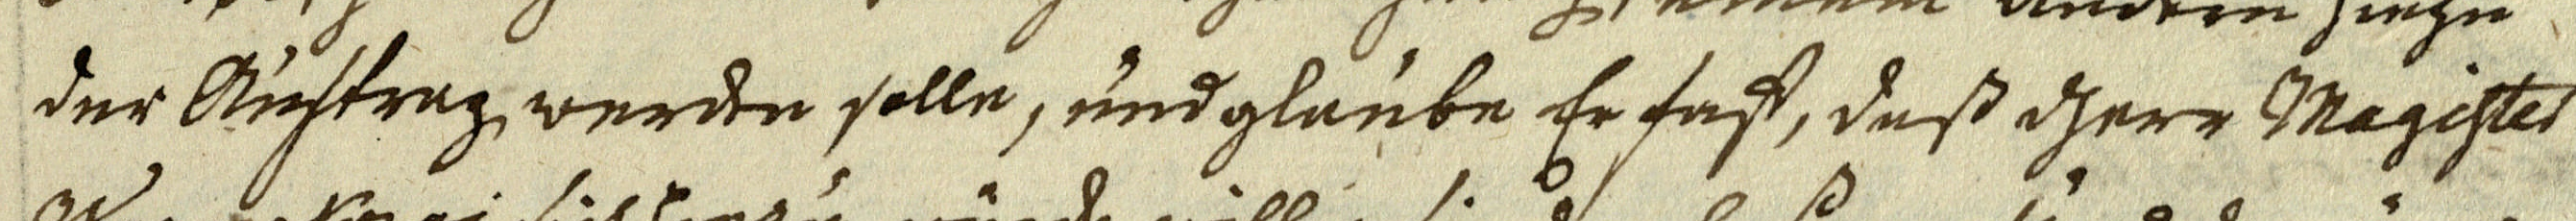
der Auftrag werden solle, und glaube Er fast, daß der Magister
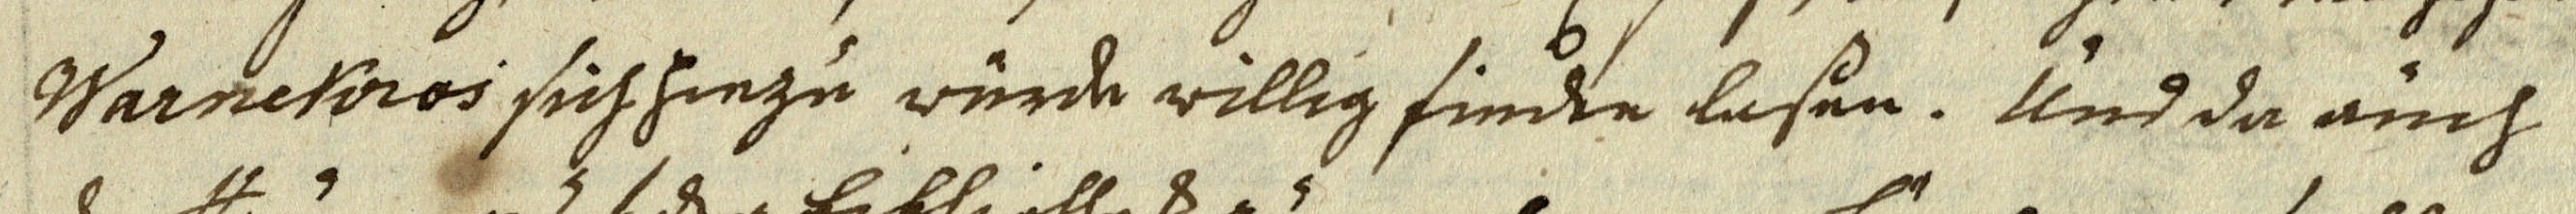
Warnekros sich hiezu würde willig finden laßen. Und da auch
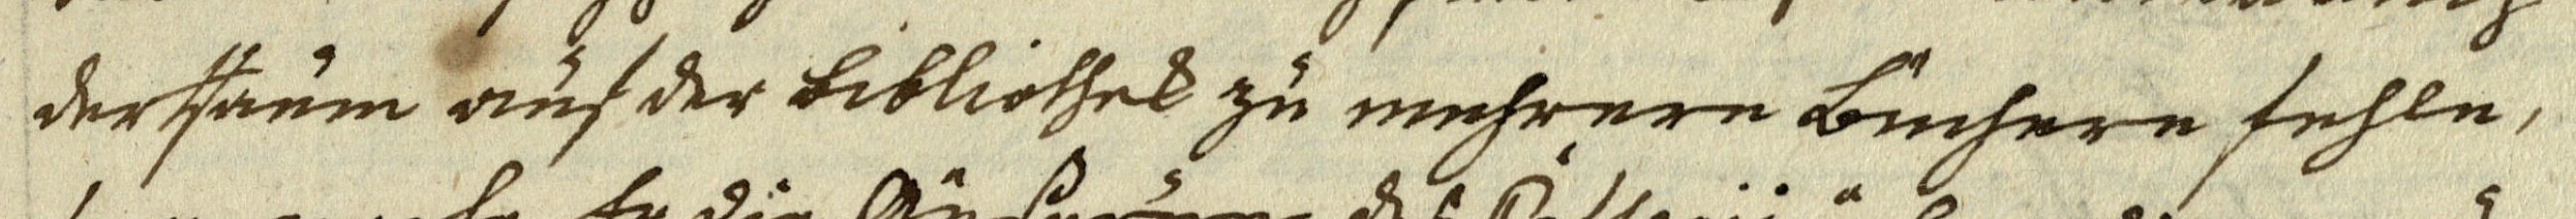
der Raum auf der Bibliothek zu mehrern Büchern fehle,
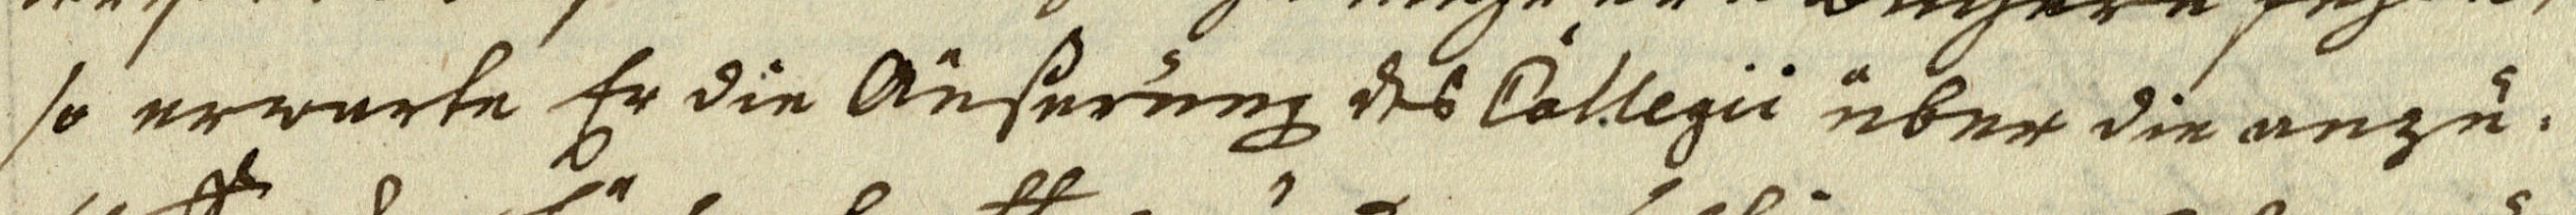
so erwarte Er die Äußerung des Collegii über die anzu¬
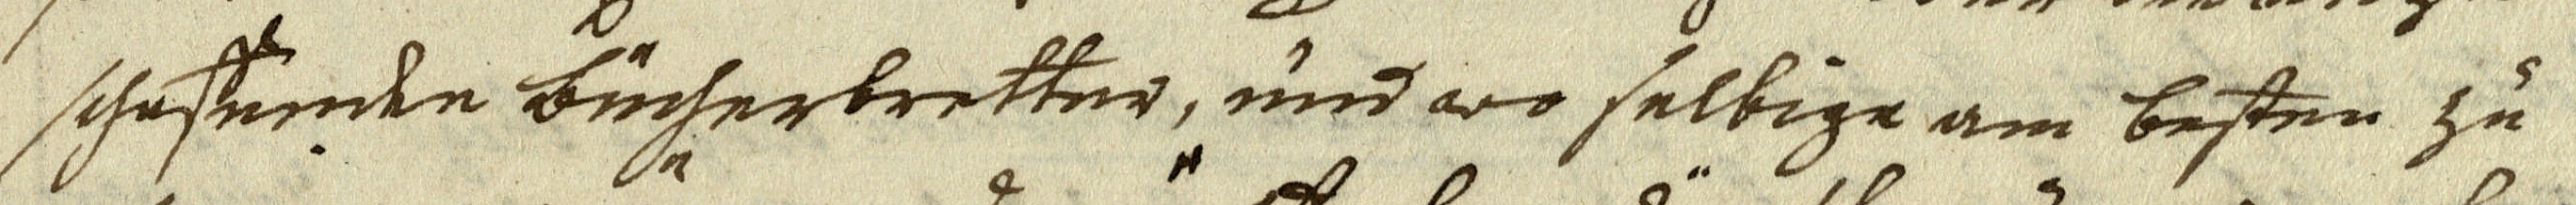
schaffenden Bücherbretter, und wo selbige an besten zu
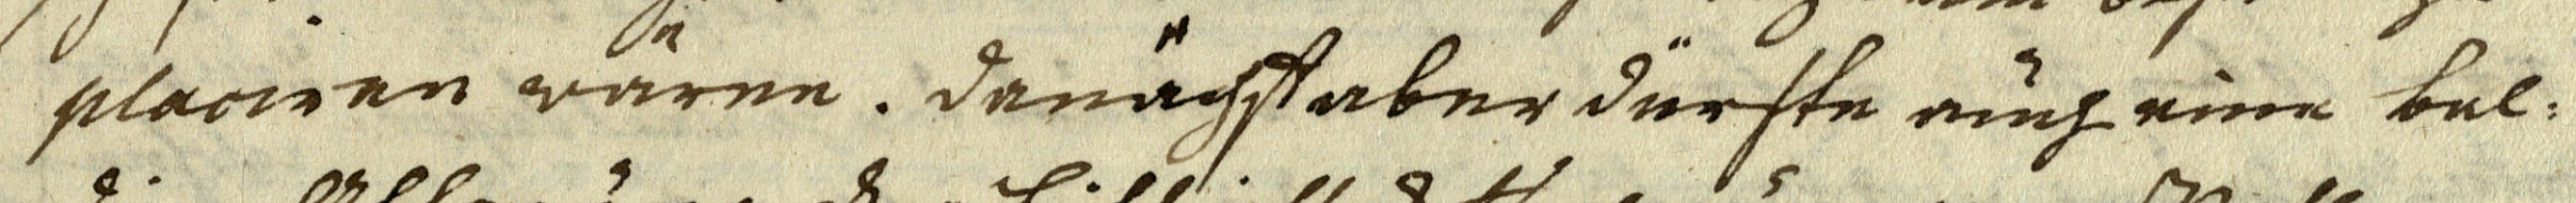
placiren wären. Danächst aber dürfte auch eine bal¬
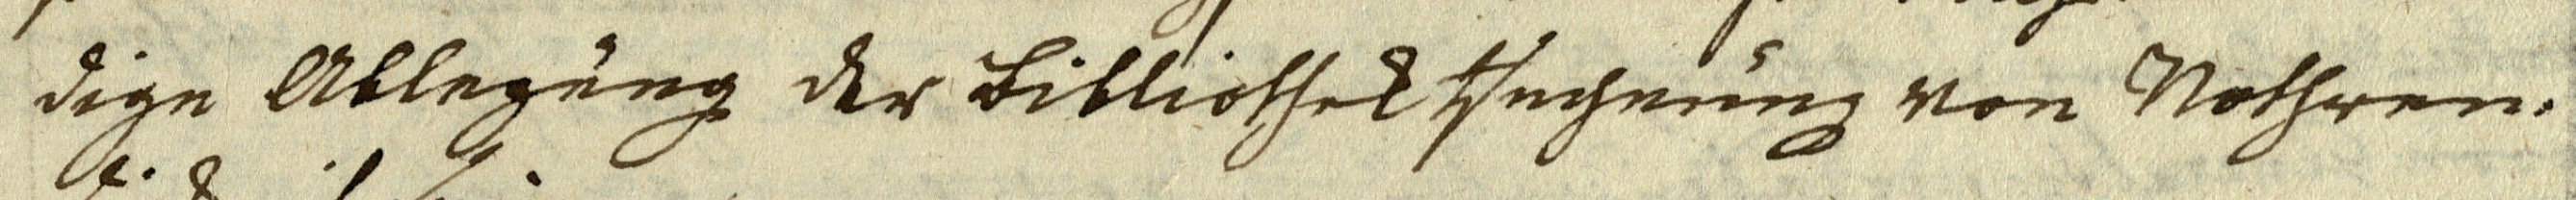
dige Ablegung der Bibliothek Rechnung von Nothwen¬
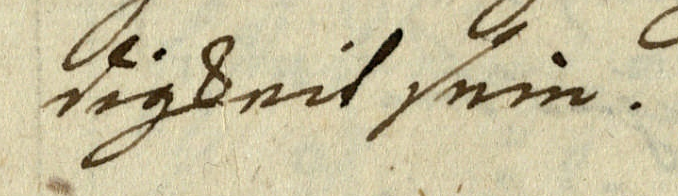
digkeit sein.
